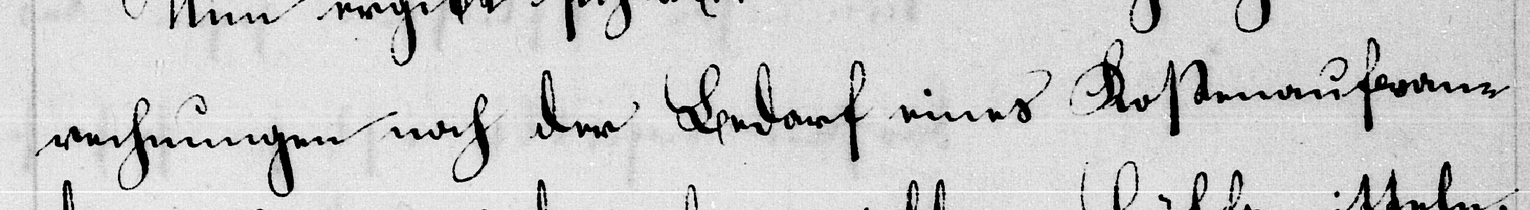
rechnungen noch der Bedarf eines Kostenaufwan¬
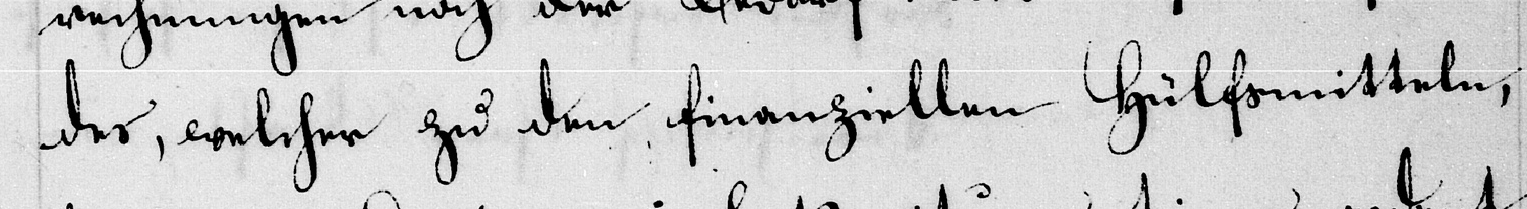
des, welcher zu den finanziellen Hülfsmitteln,
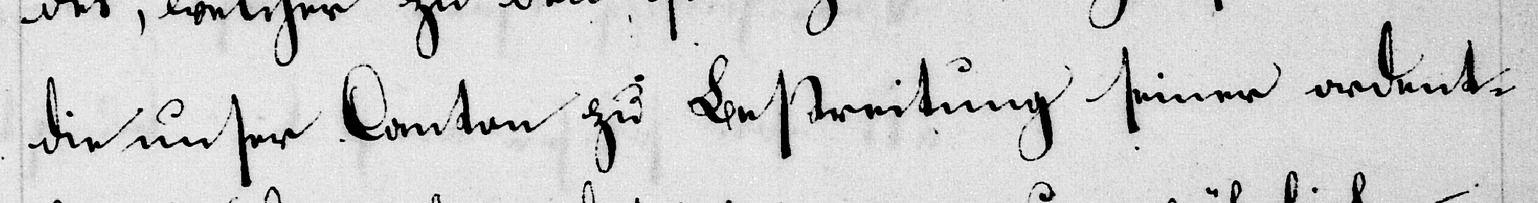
die unser Canton zu Bestreitung seiner ordent¬
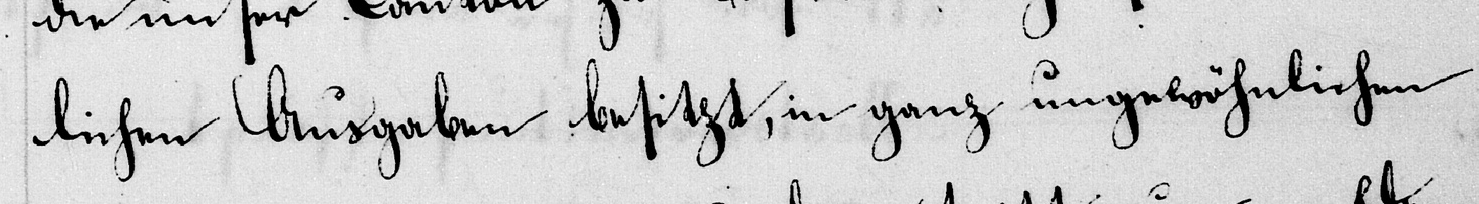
lichen Ausgaben besitzt, in ganz ungewöhnlichen
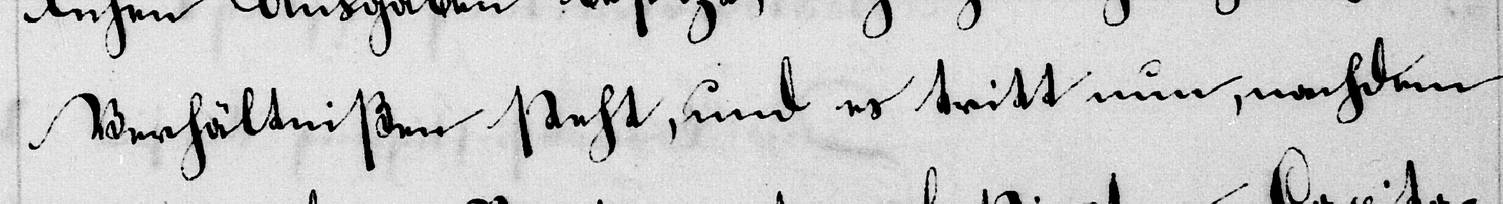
Verhältnißen steht, und es tritt nun, nachdem
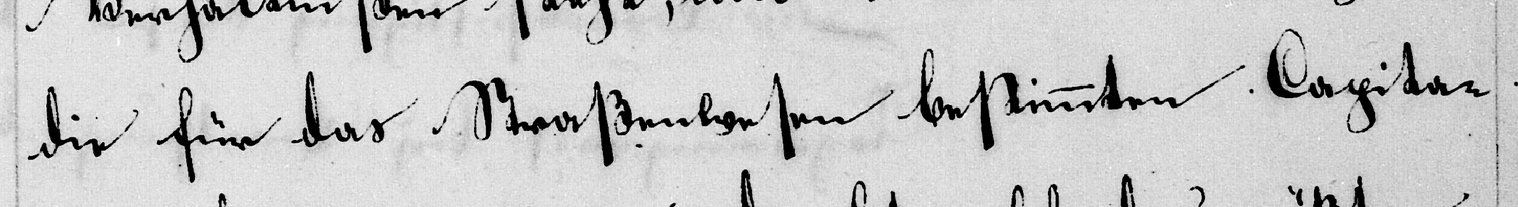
die für das Straßenwesen bestimmten Capita¬
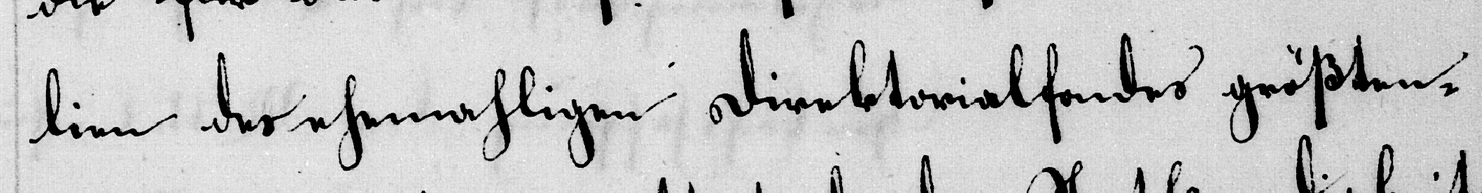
lien des ehemahligen Direktionalfondes größten¬
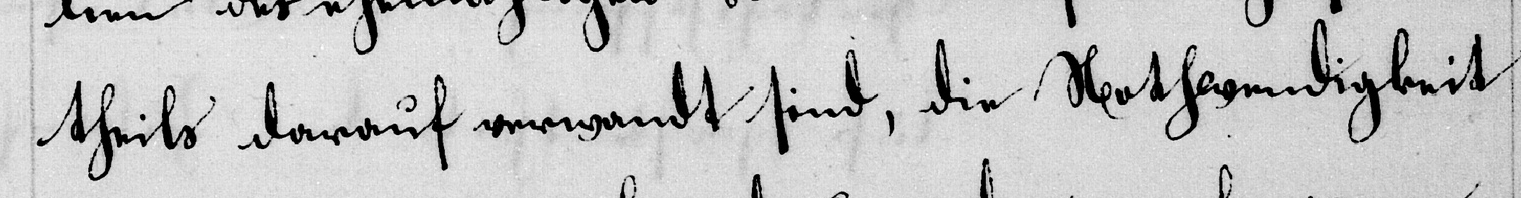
theils darauf verwandt sind, die Nothwendigkeit
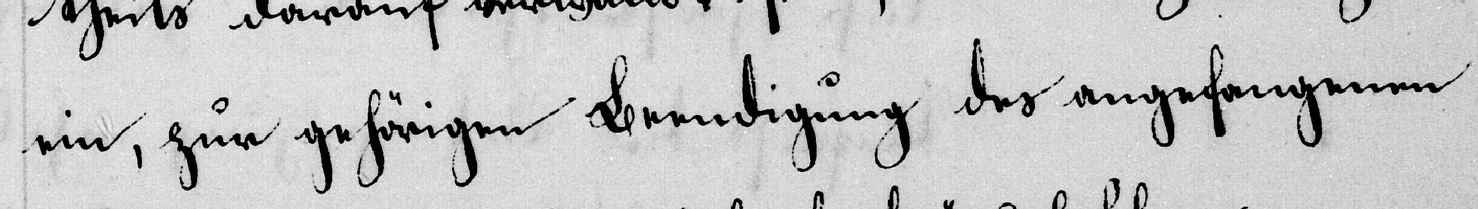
ein, zur gehörigen Beendigung des angefangenen
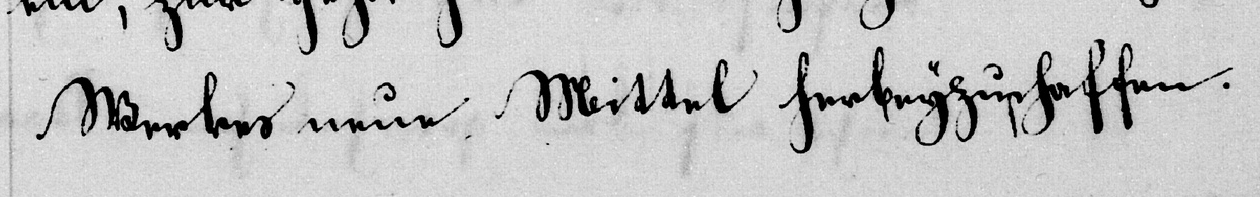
Werkes neue Mittel herbeyzuschaffen.
